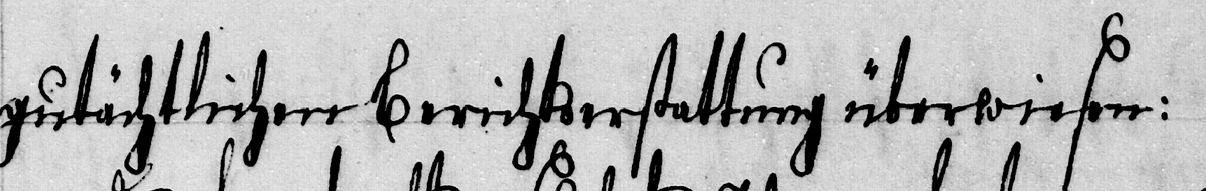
gutächtlichen Berichtserstattung überwiesen:
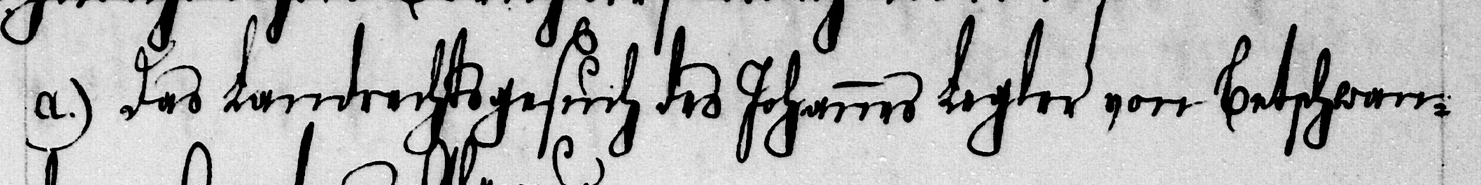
a.) Das Landrechtsgesuch des Johannes Legler von Betschwan¬
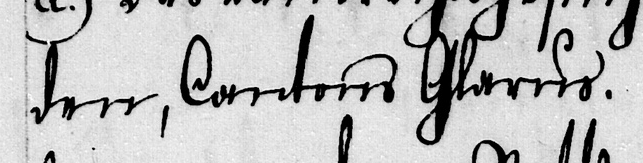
den, Cantons Glarus.
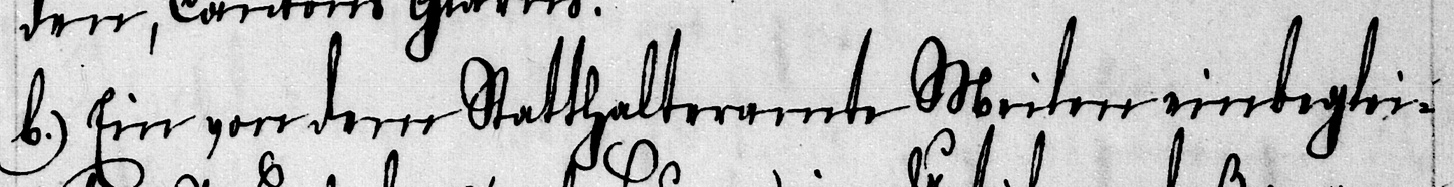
b.) Ein von dem Statthalteramte Meilen einbeglei¬
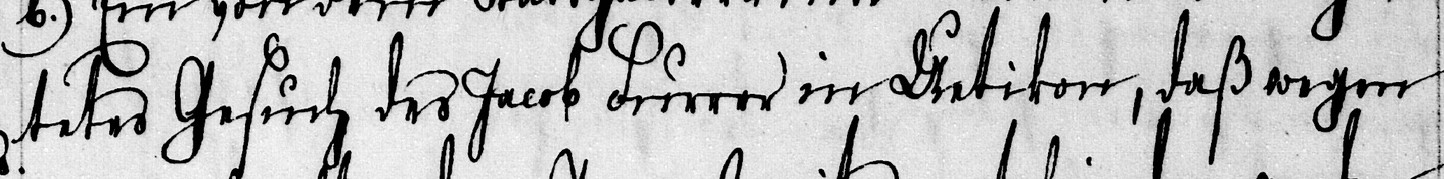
tetes Gesuch des Jacob Furrer in Uetikon, daß wegen
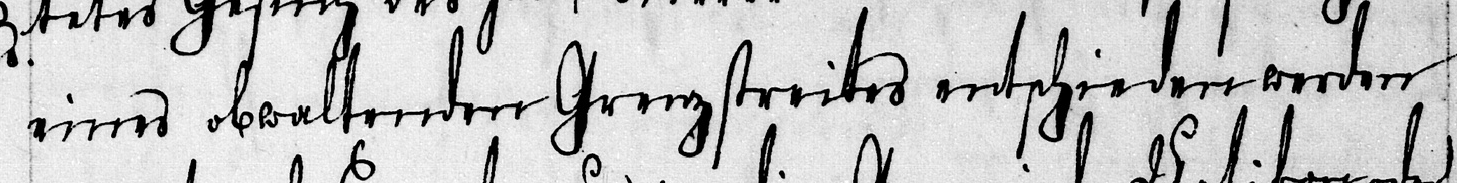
eines obwaltenden Grenzstreites entschieden werden
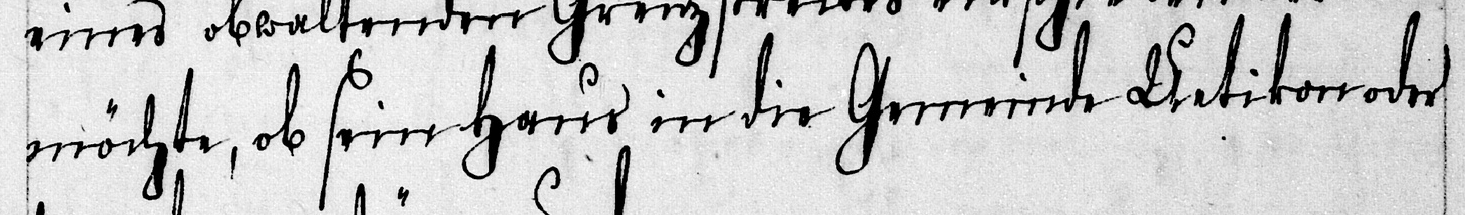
möchte, ob sein Haus in die Gemeinde Uetikon oder
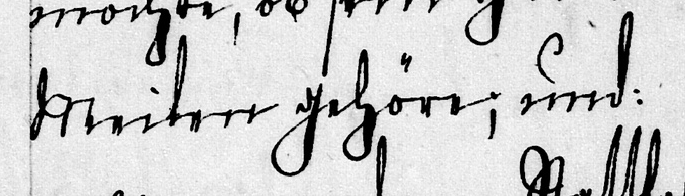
Meilen gehöre; und:
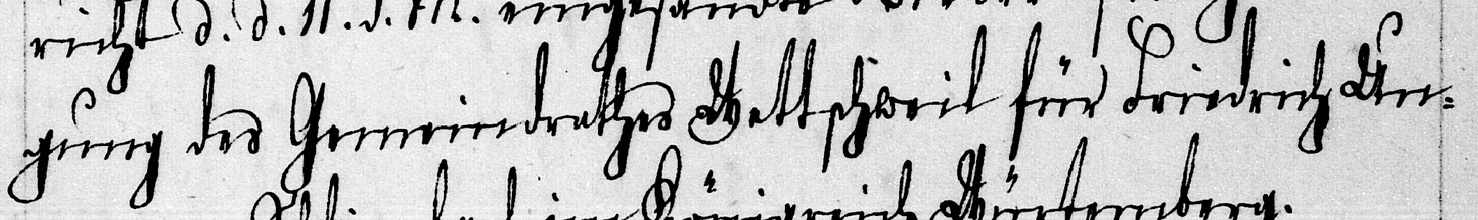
gung des Gemeindrathes Wettschweil für Friedrich Un¬
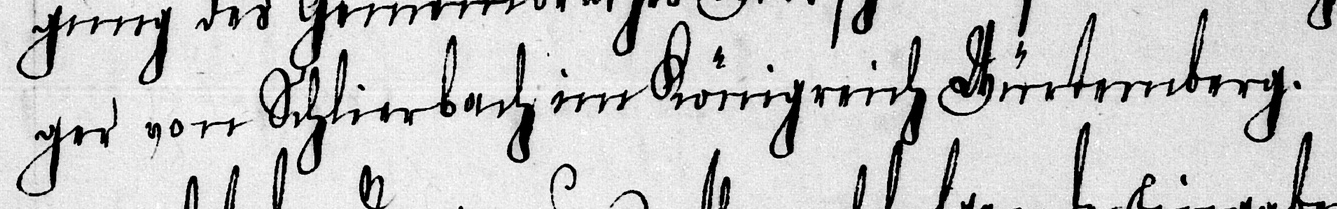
ger von Schlierbach im Königreich Würtemberg.
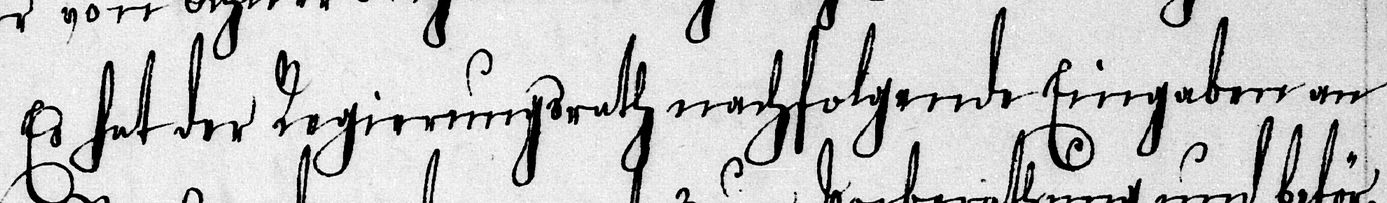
Es hat der Regierungsrath nachfolgende Eingaben an
